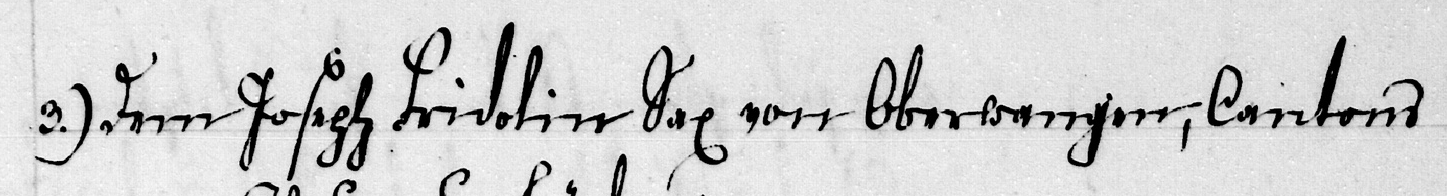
3.) Dem Joseph Fridolin Sax von Oberwangen, Cantons
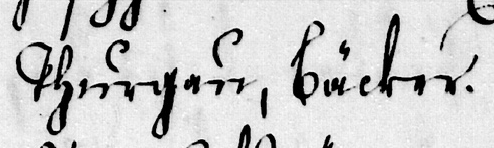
Thurgau, Bäcker.
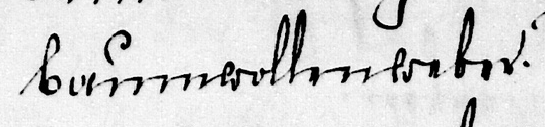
Baumwollenweber.
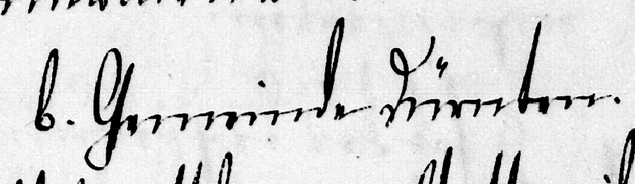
b. Gemeinde Dürnten.
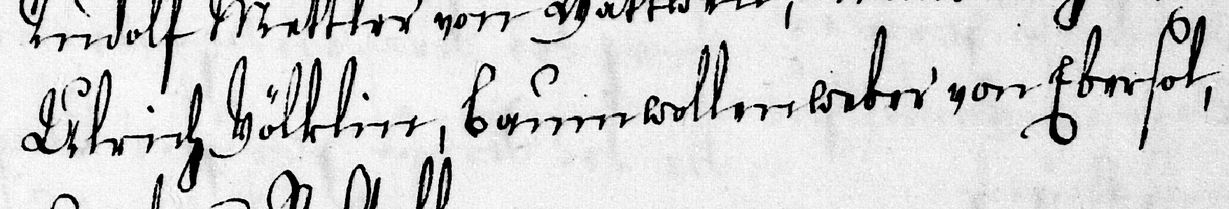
lrich Völklin, Baumwollenweber von Ebersol,
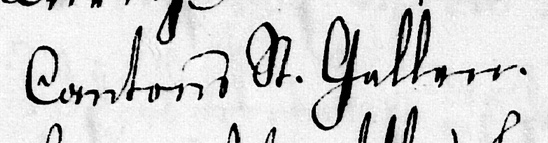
Cantons St. Gallen.
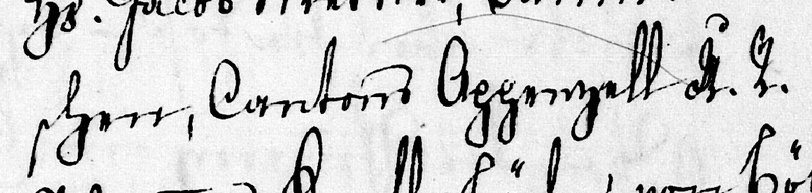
schen, Cantons Appenzell A. R.
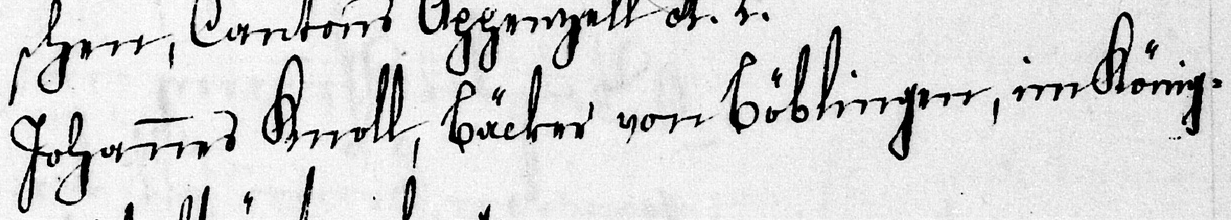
ohannes Knoll, Bäcker von Böblingen, im König¬
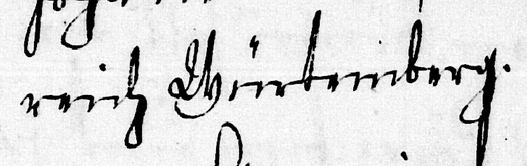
reich Würtemberg.
